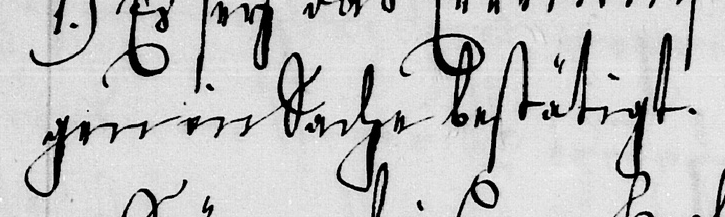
gen in Sache bestätigt.
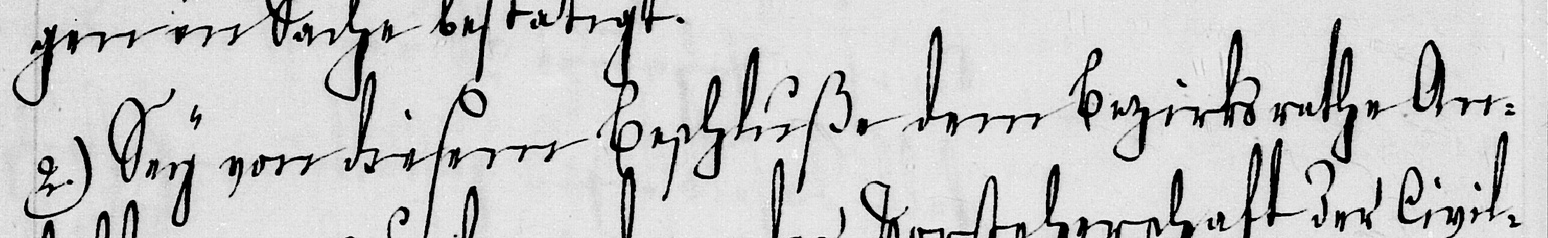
2.) Sey von diesem Beschluße dem Bezirksrathe An¬
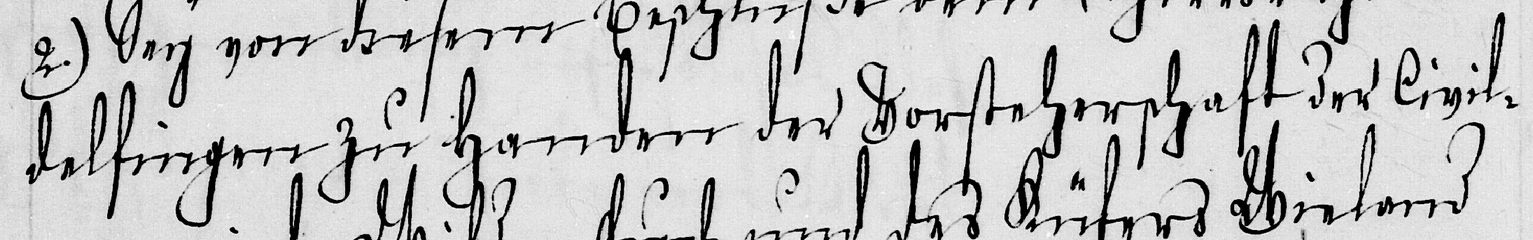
delfingen zu Handen der Vorsteherschaft der Civil¬
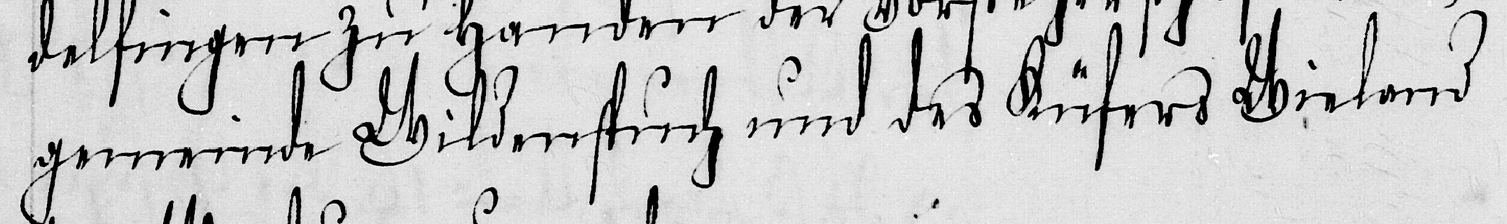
gemeinde Wildenspuch und des Küfers Wieland
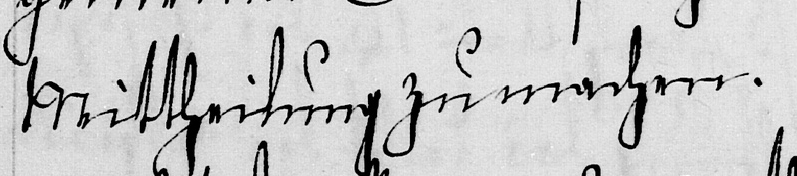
Mittheilung zu machen.
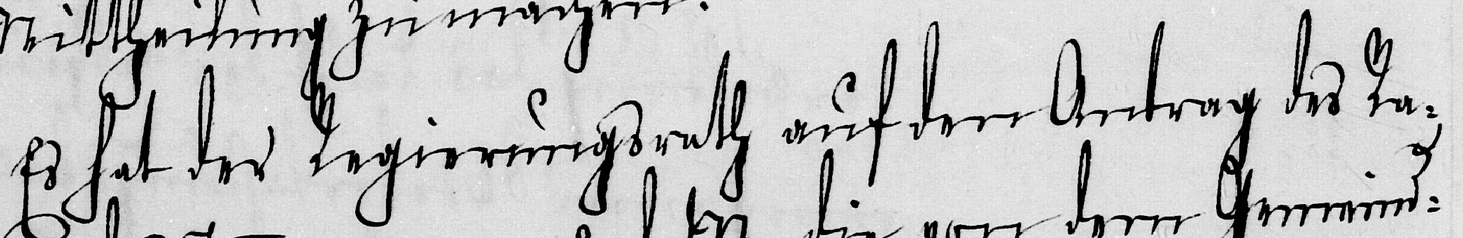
Es hat der Regierungsrath auf den Antrag des Ra¬
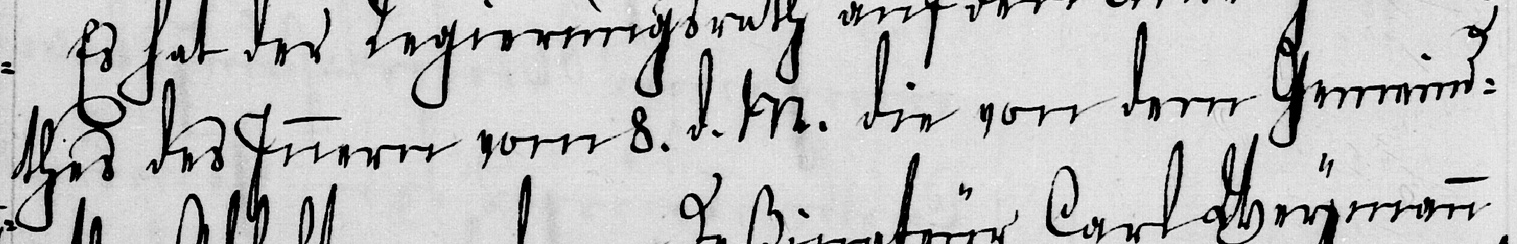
thes des Innern vom 8. d. M. die von dem Gemeind¬
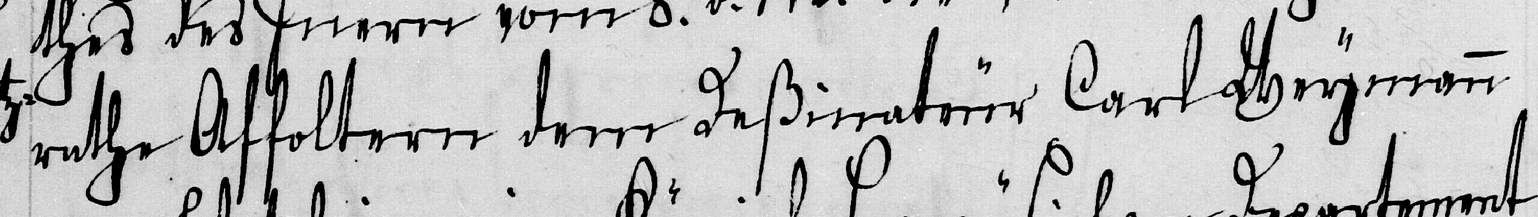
rathe Affoltern dem Deßinateur Carl Weymann
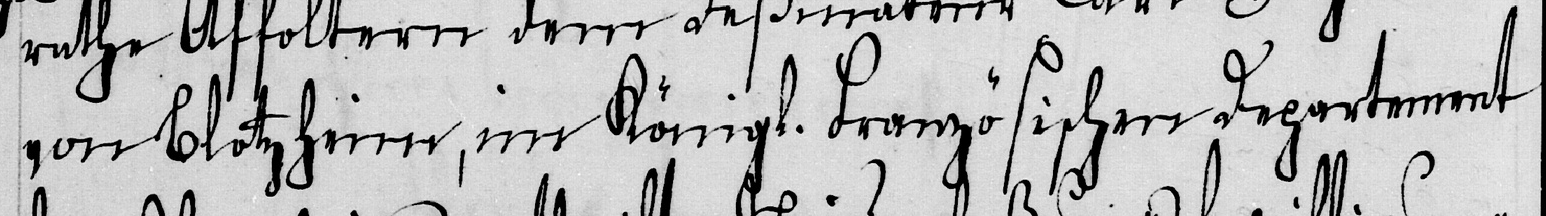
von Blotzheim, im Königl. Französischen Departement
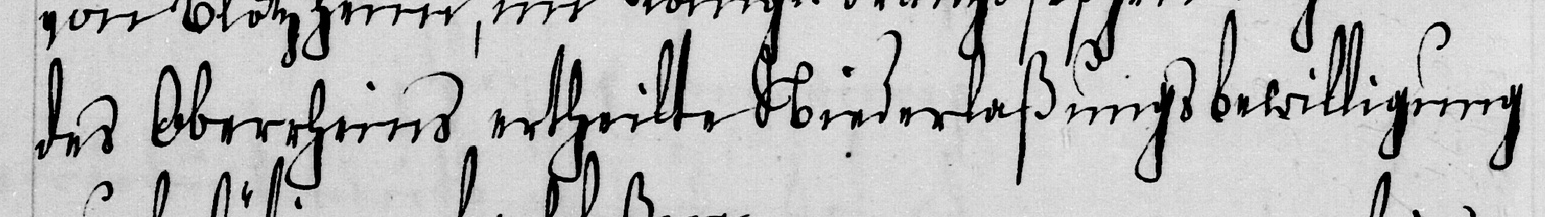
des Oberrheins ertheilte Niederlaßungsbewilligung
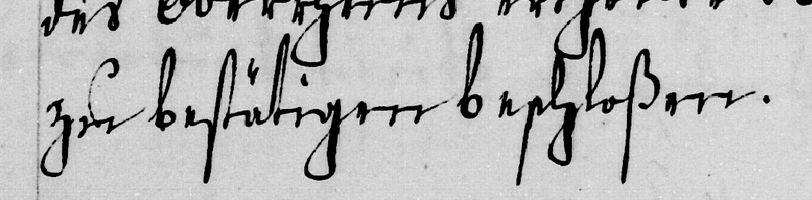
zu bestätigen beschloßen.
